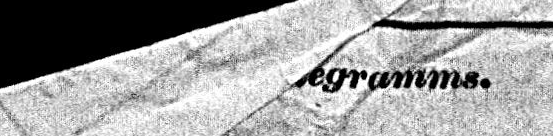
Classe des Telegramms.
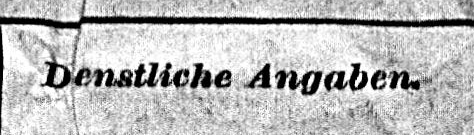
Dienstliche Angaben.
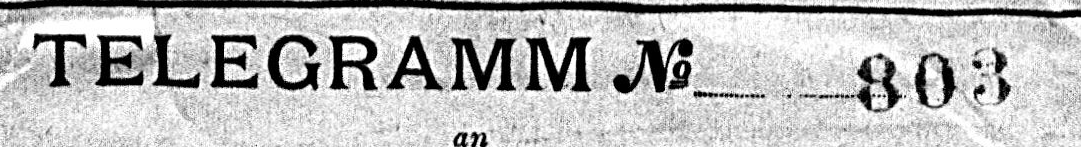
TELEGRAMM N° 803
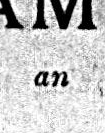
an
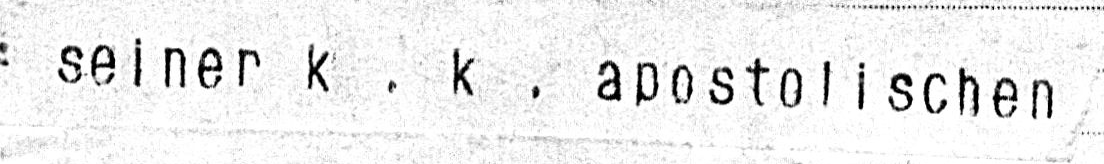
seiner k. k. apostolischen
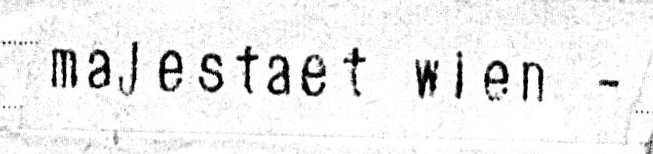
majestaet wien -
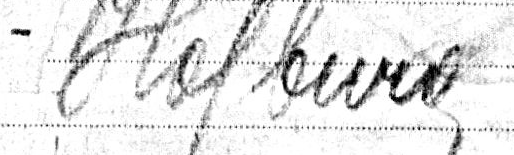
Hofburg
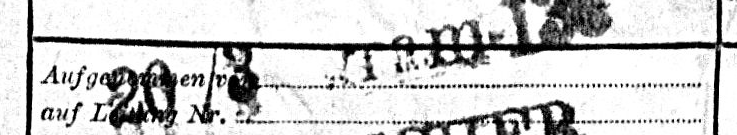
Aufgegeben am ....... 18.......
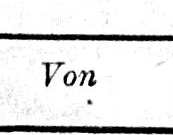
Von
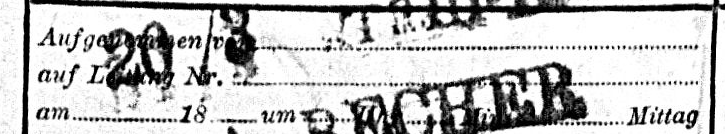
auf Leitung N°.......
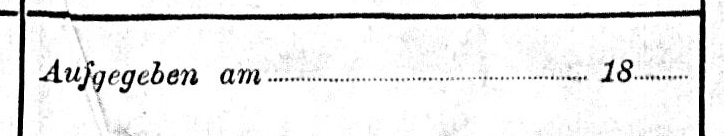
Aufgegeben am ....... 18.......
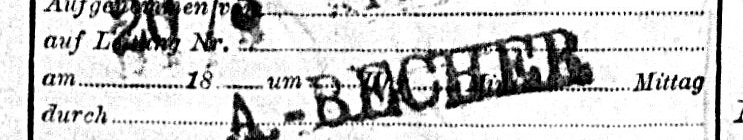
am ........ 18 .... um .... Uhr .... Min .... Mittag
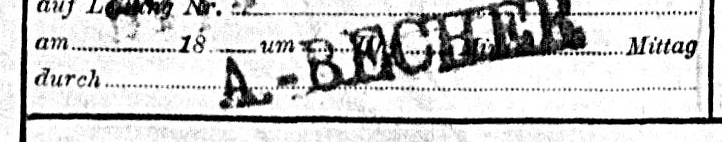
durch .....
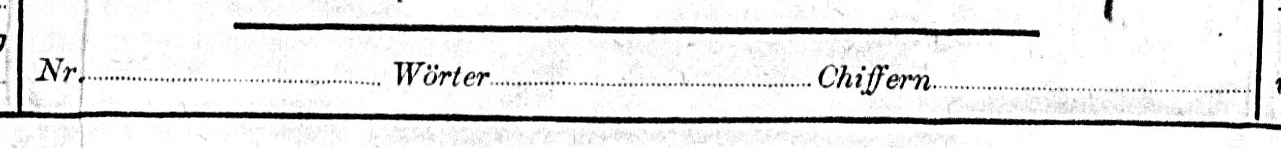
N°.... Wörter .....Chiffern
